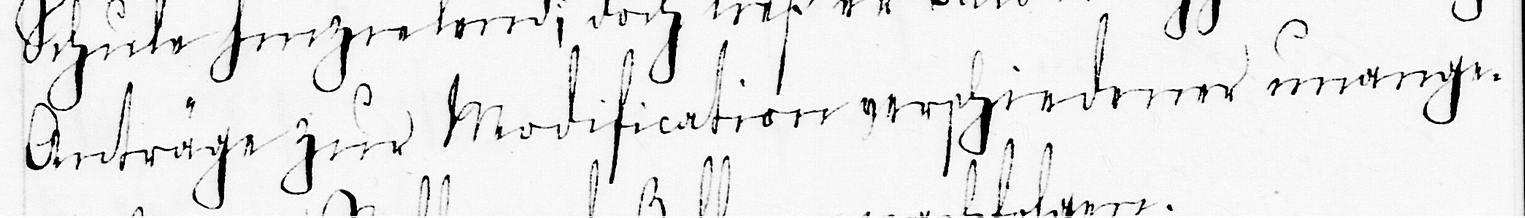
Anträge zur Modification verschiedener unange¬
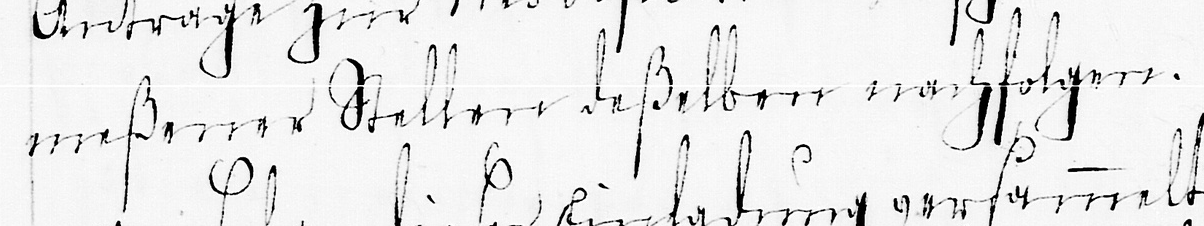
meßener Stellen deßelben nachfolgen.
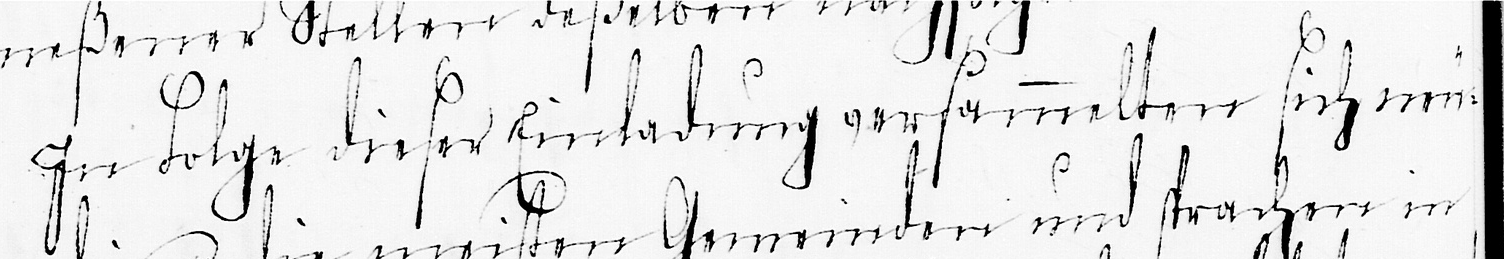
In Folge dieser Einladung versammelten sich neu¬
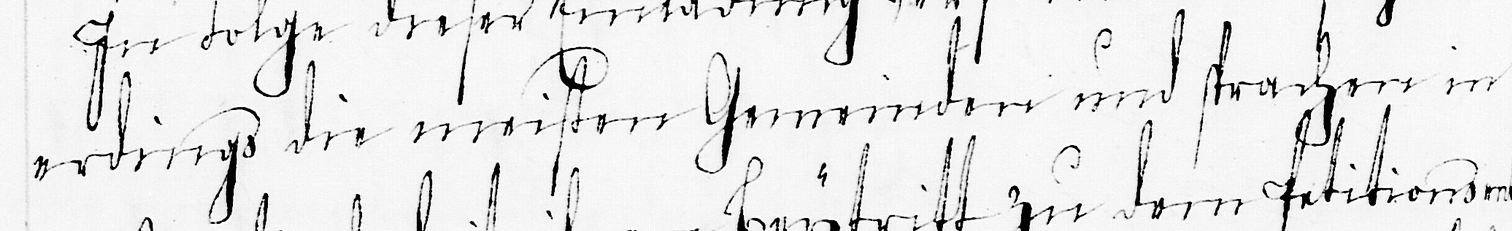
erdings die meisten Gemeinden und sprachen in
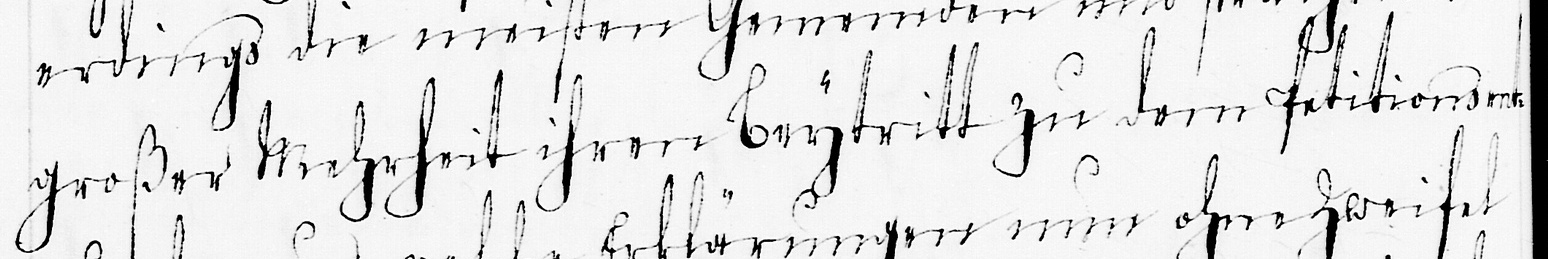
großer Mehrheit ihren Beytritt zu dem Petitionsen¬
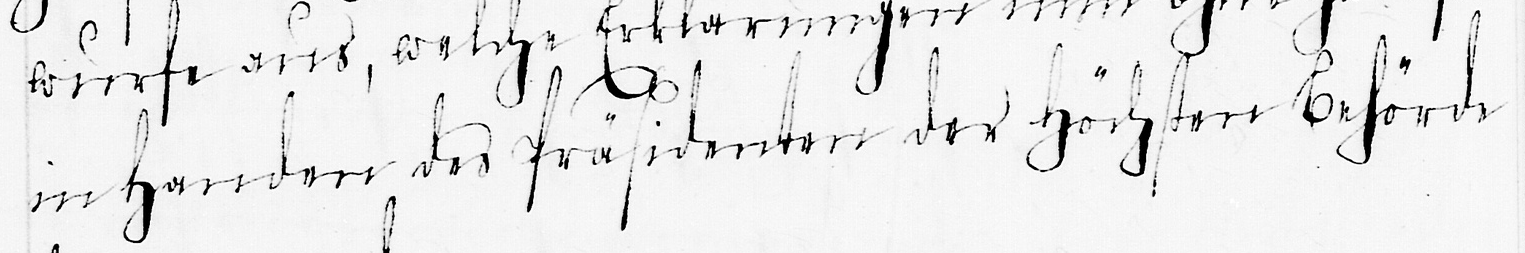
in Handen des Präsidenten der Höchsten Behörde
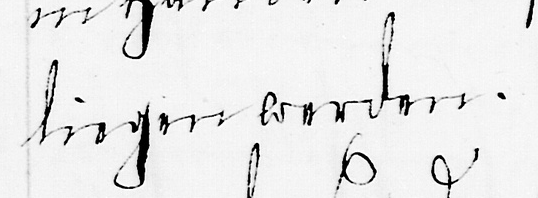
liegen werden.
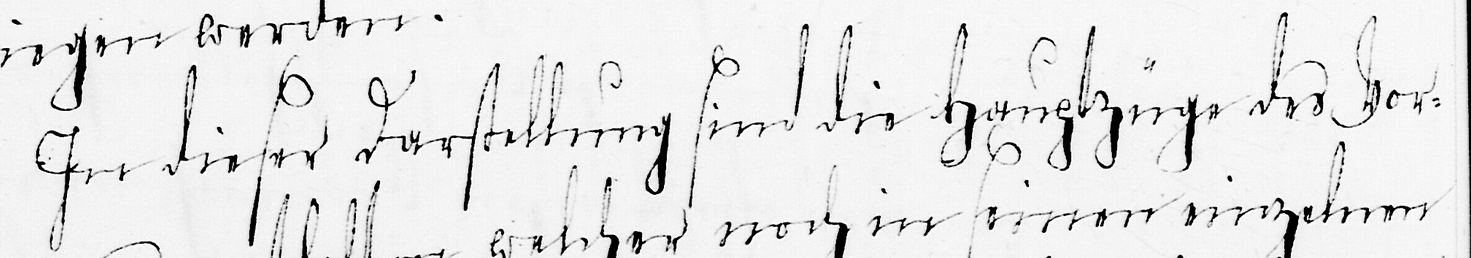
In dieser Darstellung sind die Hauptzüge des Vor¬
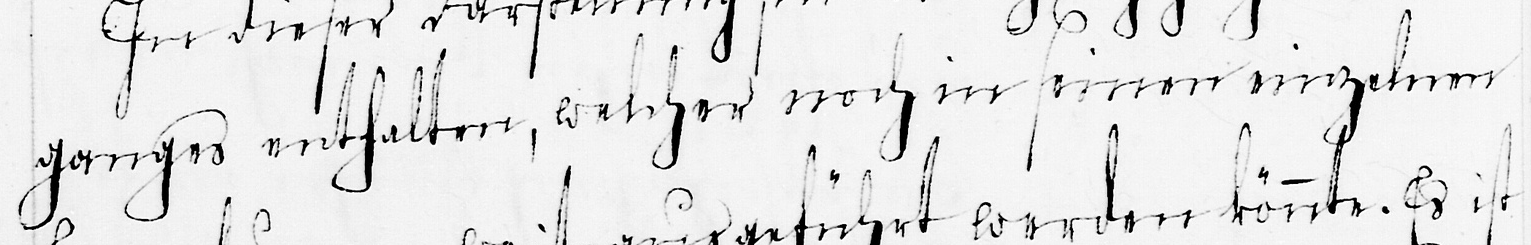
ganges enthalten, welcher noch in seinen einzelnen
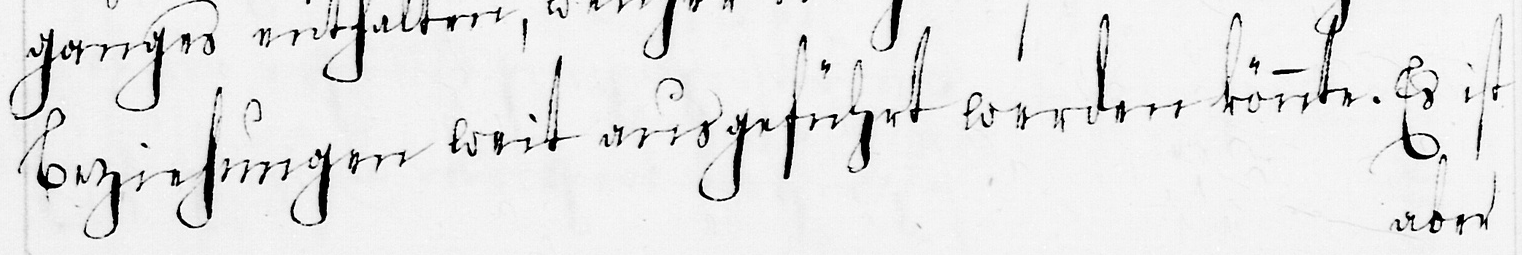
Beziehungen weit ausgeführt werden könnte. Es ist
